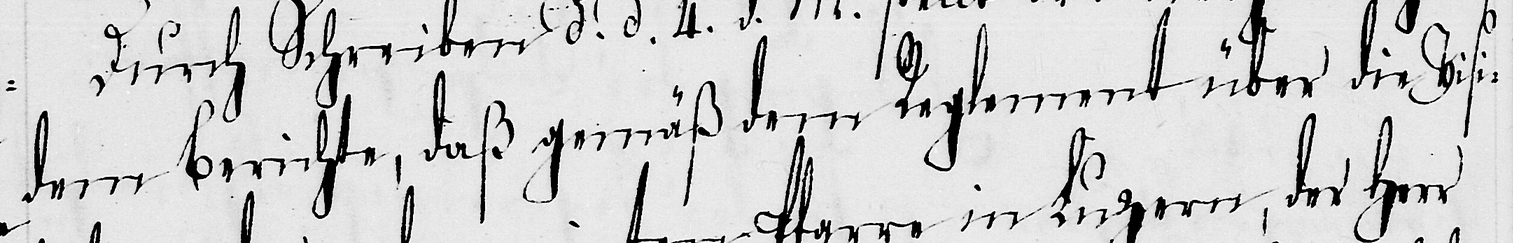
dem Berichte, daß gemäß dem Reglement über die Visi¬
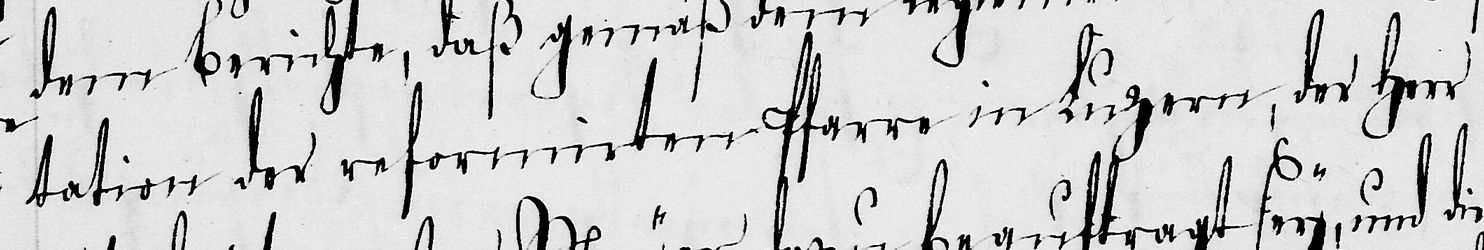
tation der reformirten Pfarre in Luzern, der Her¬
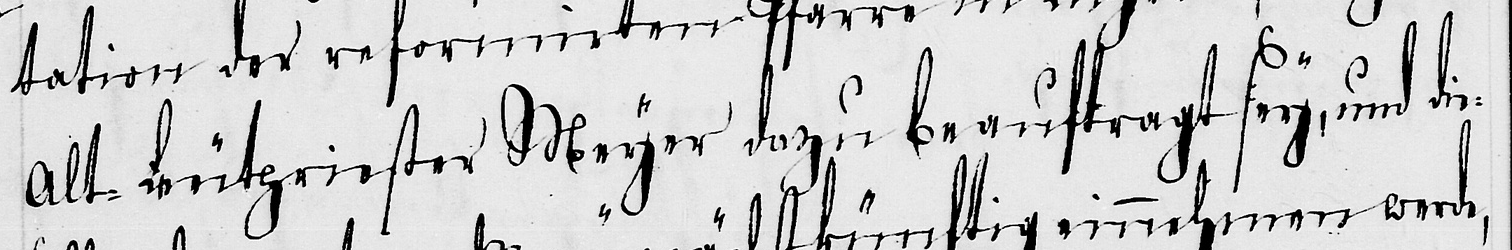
Alt-Leutpriester Meyer dazu beauftragt sey, und di¬
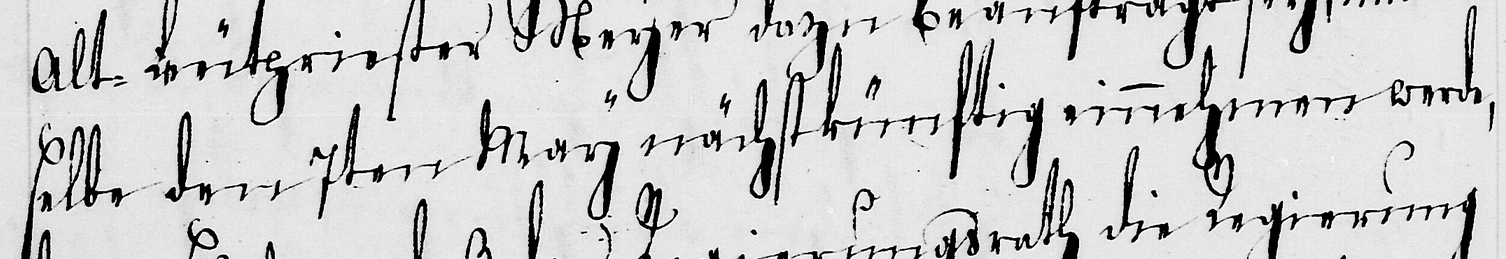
selbe den 7ten May nächstkünftig einnehmen werd¬
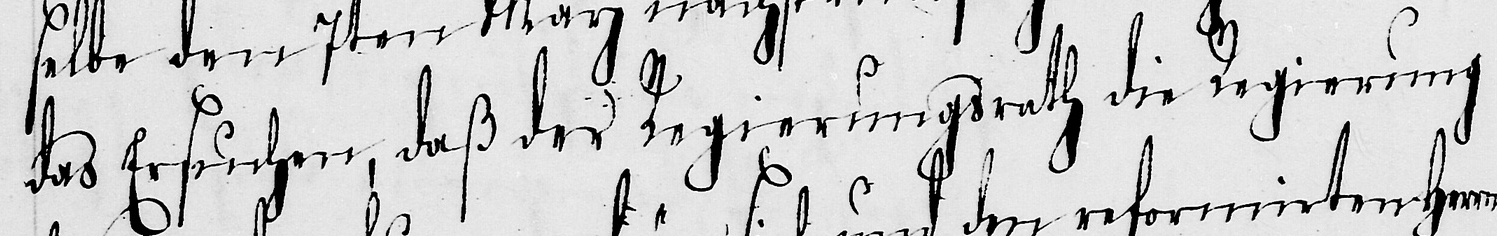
das Ersuchen, daß der Regierungsrath die Regierung
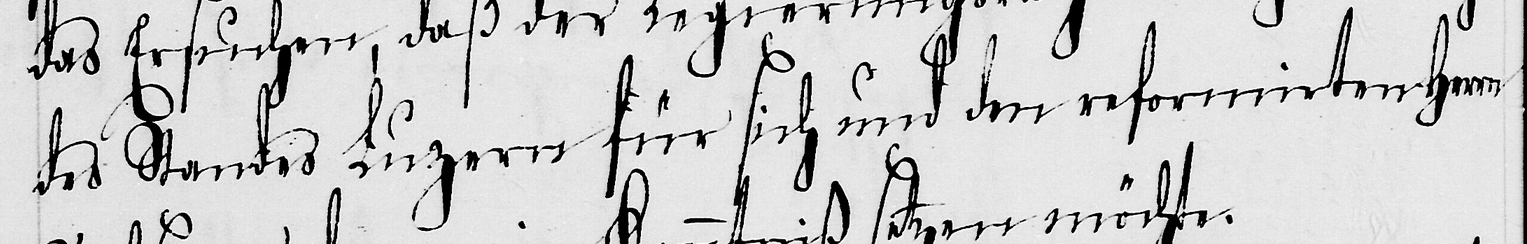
des Standes Luzern für sich und den reformirten Her¬
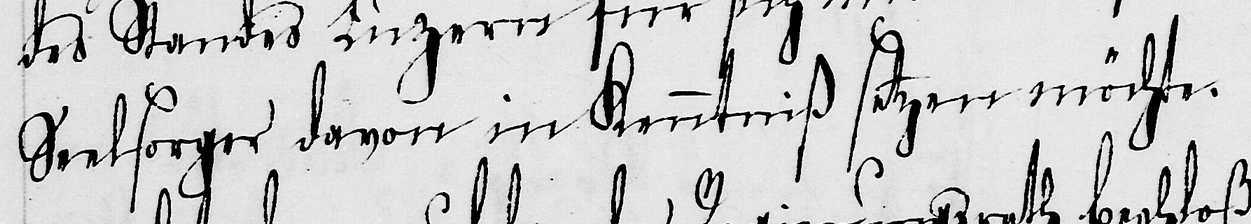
Seelsorger davon in Kenntniß setzen möchte.
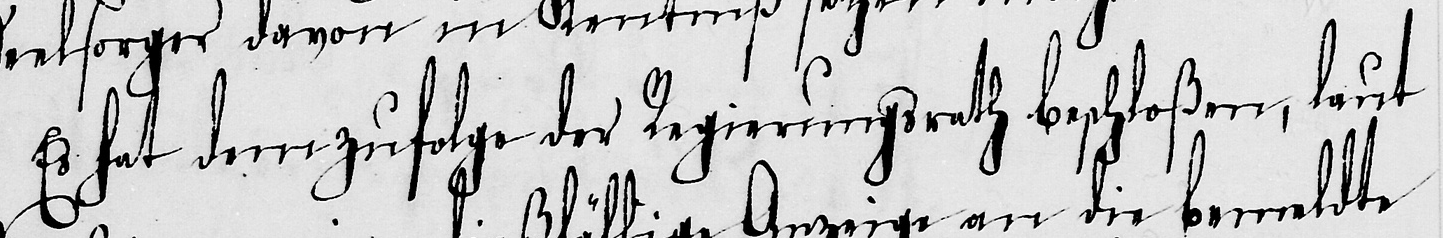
Es hat demzufolge der Regierungsrath beschloßen, laut
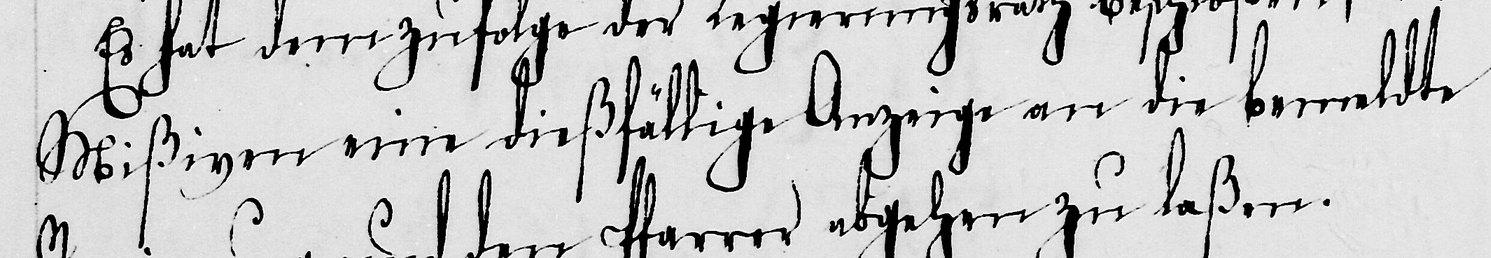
Mißiven eine dießfällige Anzeige an die bemeldte
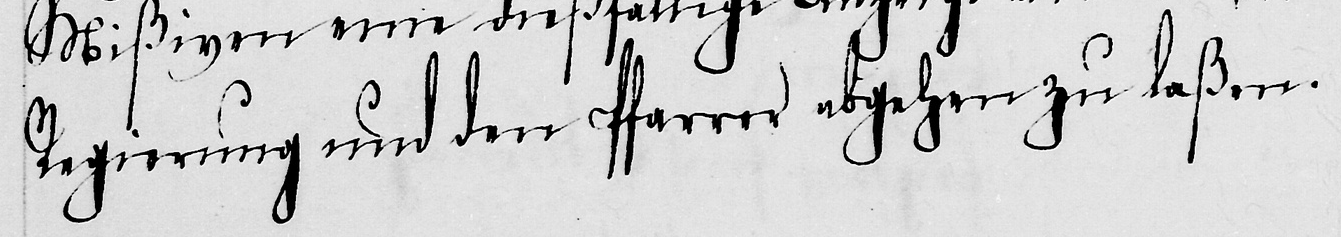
Regierung und den Pfarrer abgehen zu laßen.
